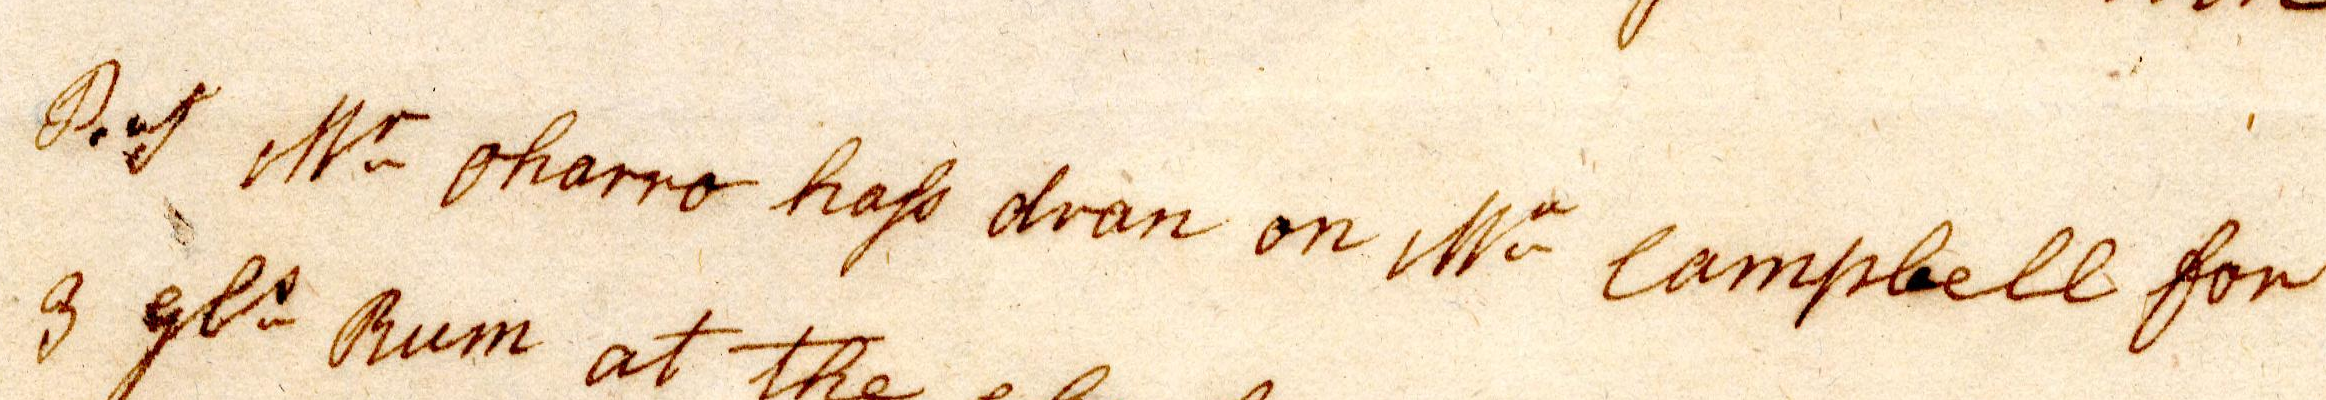P. S M^r. Oharro hass dran on M^r. Campbell for
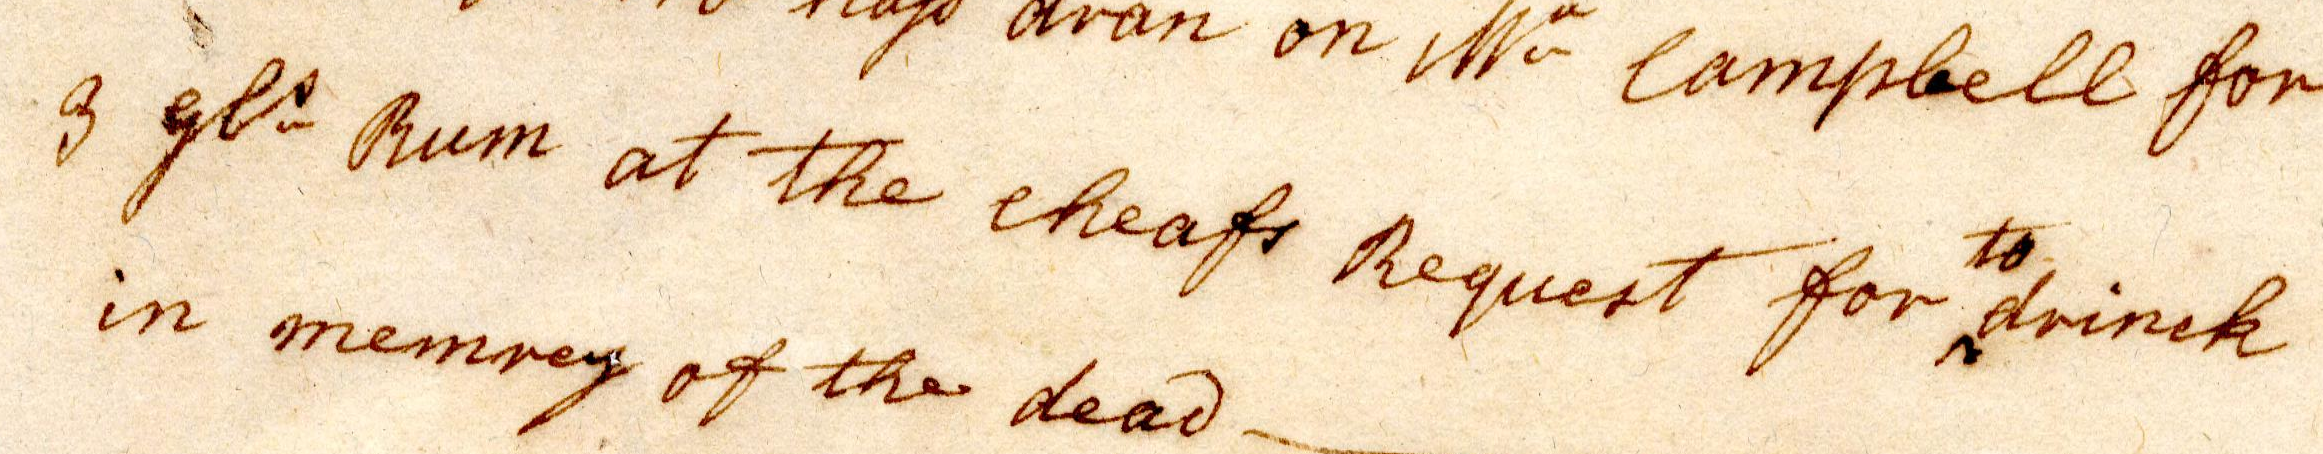3 gl^s. Rum at the cheafs Request for ^ drinck
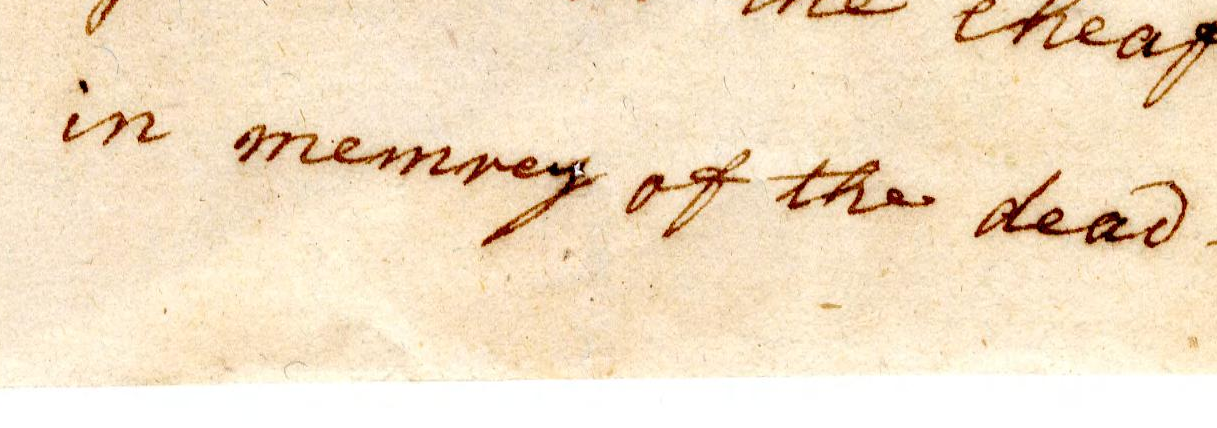in memrey of the dead-
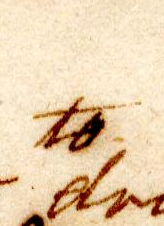to
